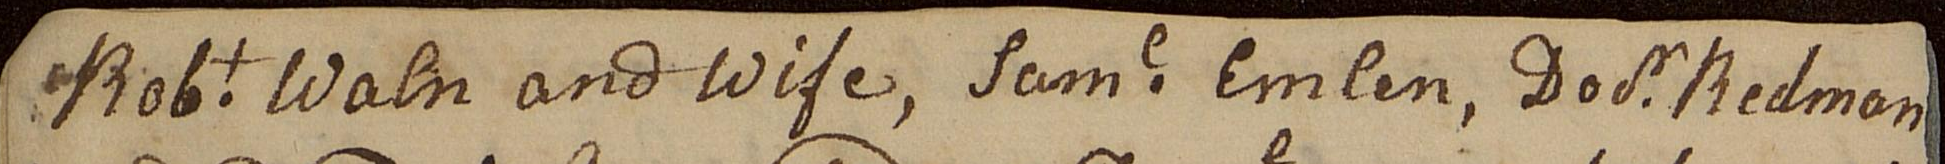Rob^t. Waln and Wife, Sam^l. Emlen, Doc^r Redman
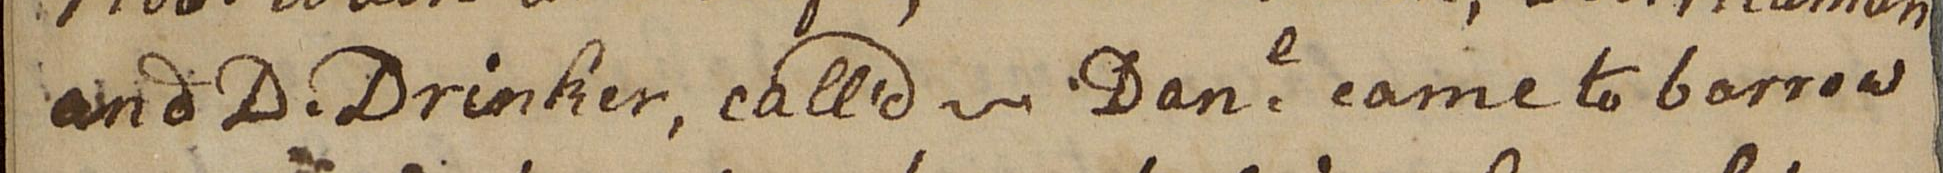and D. Drinker, call'd- Dan^l. came to barrow
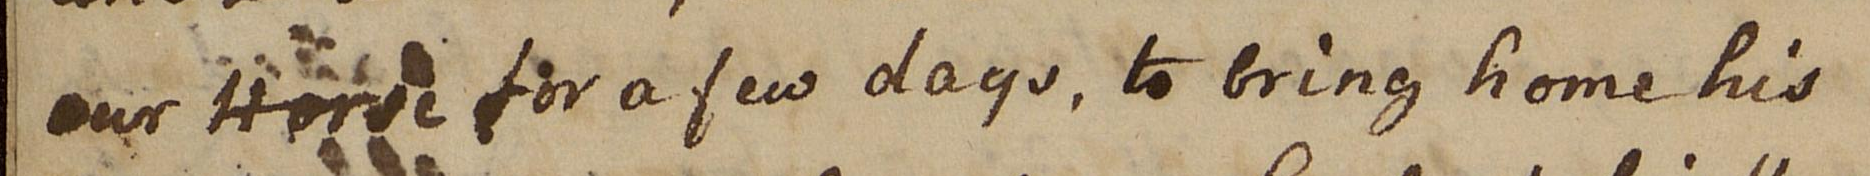our Horse for a few days, to bring home his
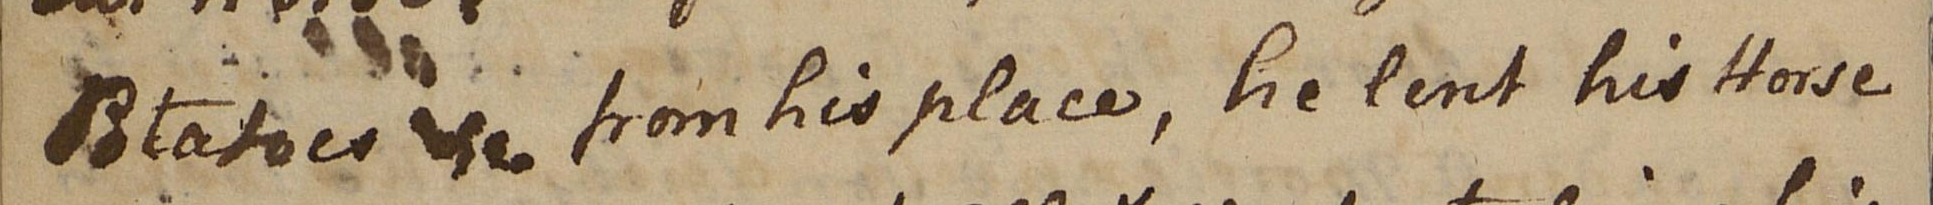Potatoes &c from his place, he lent his Horse
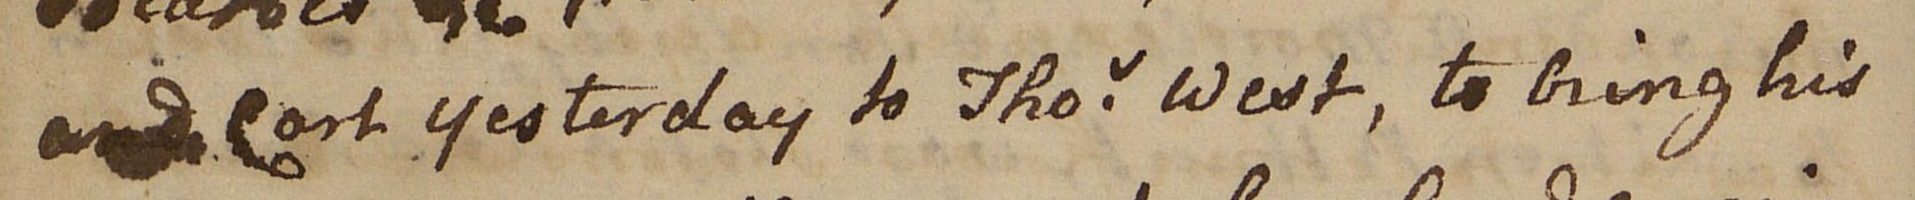and Cart yesterday to Tho^s. West, to bring his
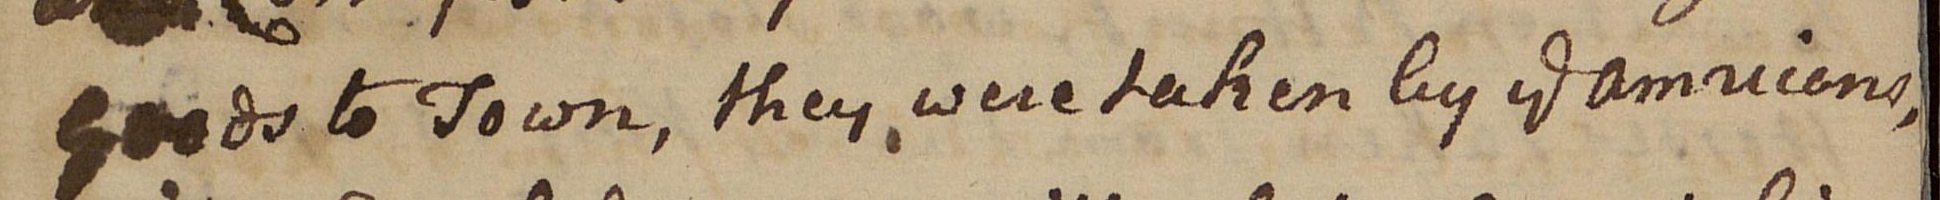Goods to Town, they were taken by y^e Amricans,
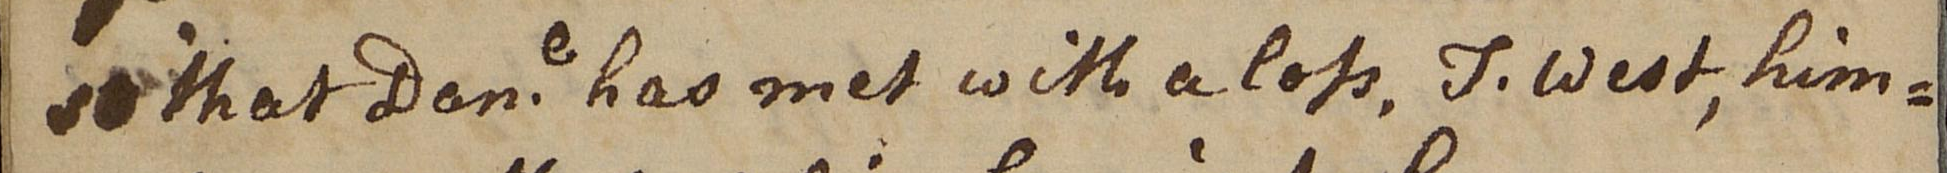so that Dan^l. has met with a loss, J. West, him-
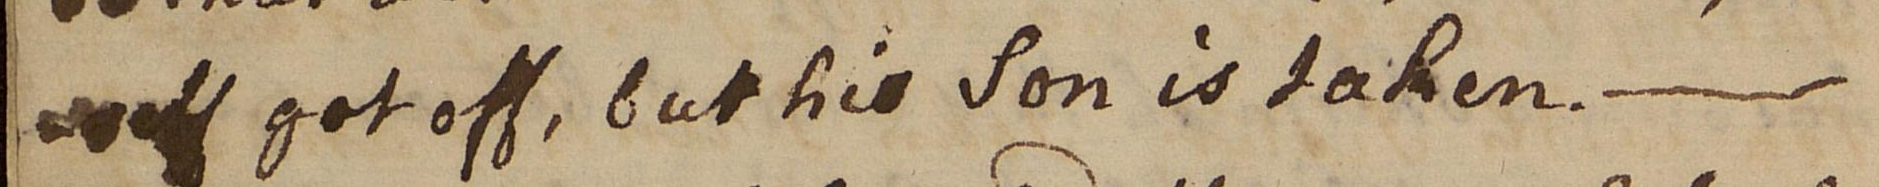self got off, but his Son is taken.-
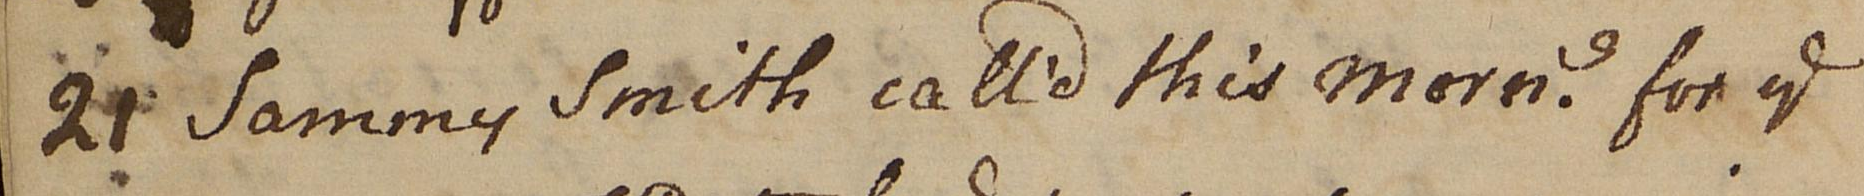21 Sammy Smith call'd this morn^g. for y^e
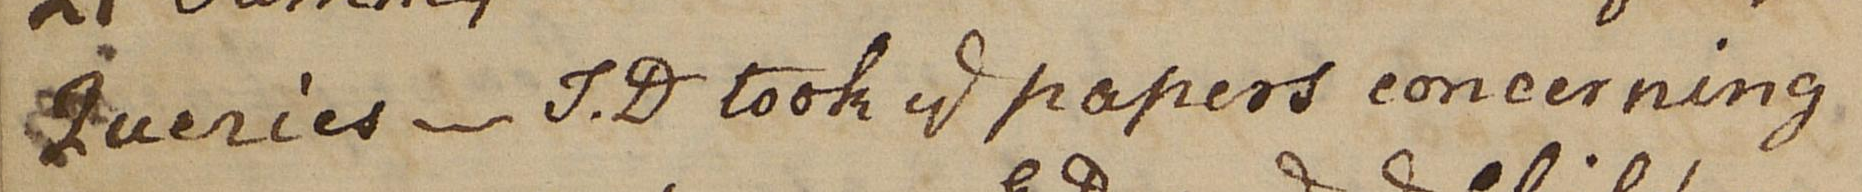Queries- J.D took y^e papers concerning
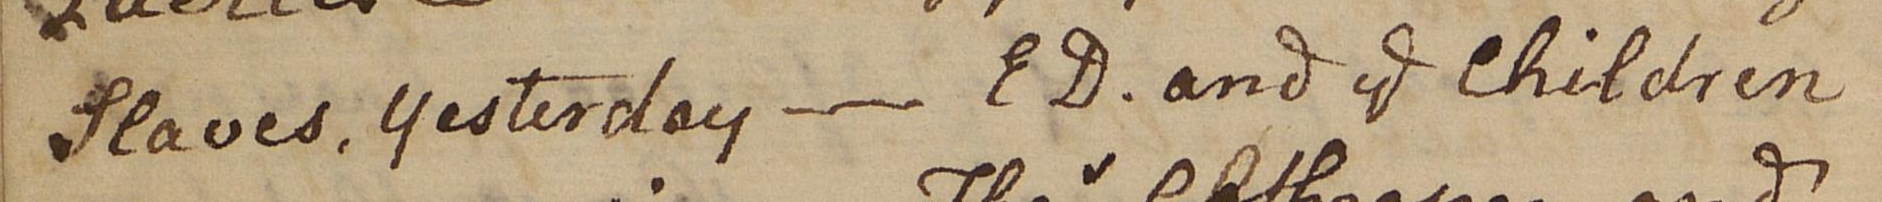Slaves Yesterday- E D. and y^e Children
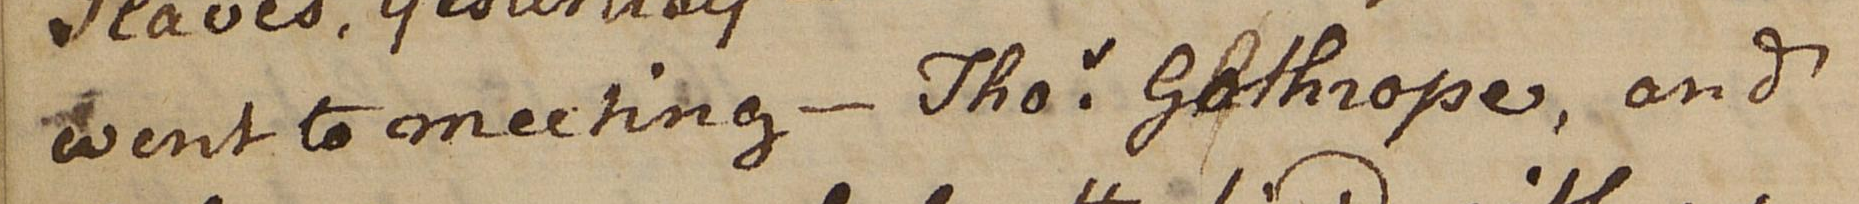went to meeting- Tho^s. Gothrope, and
